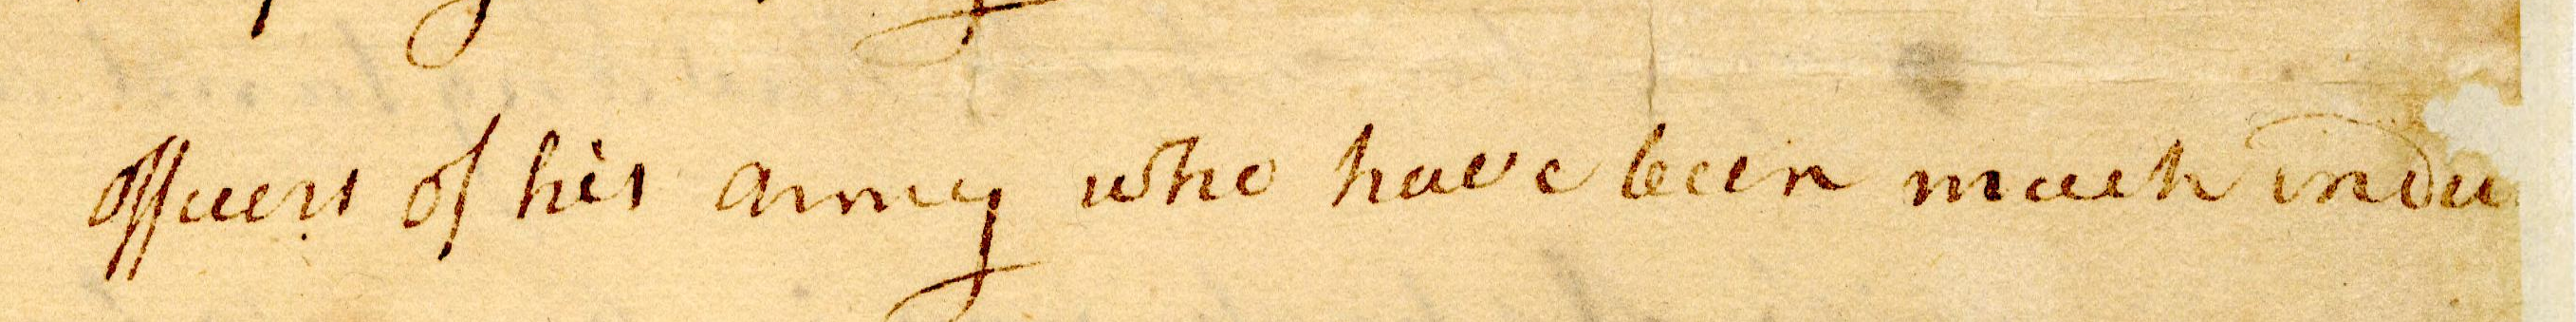officers of his army who have been much indu
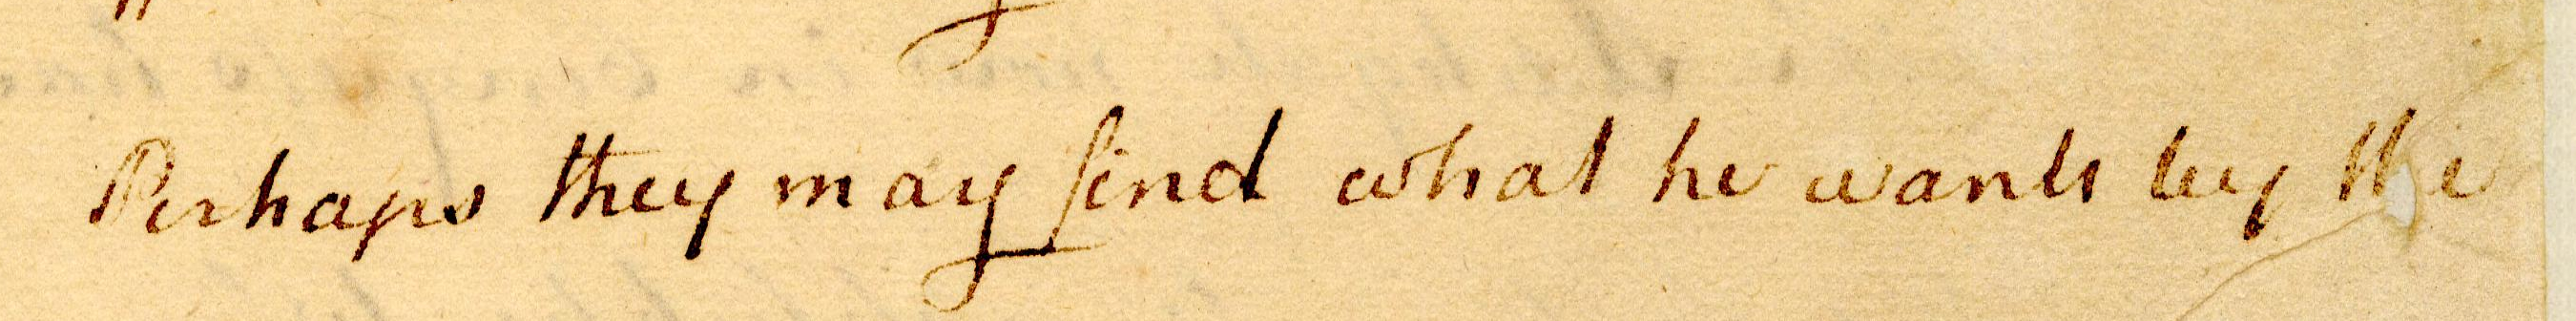Perhaps they may find what he wants by the
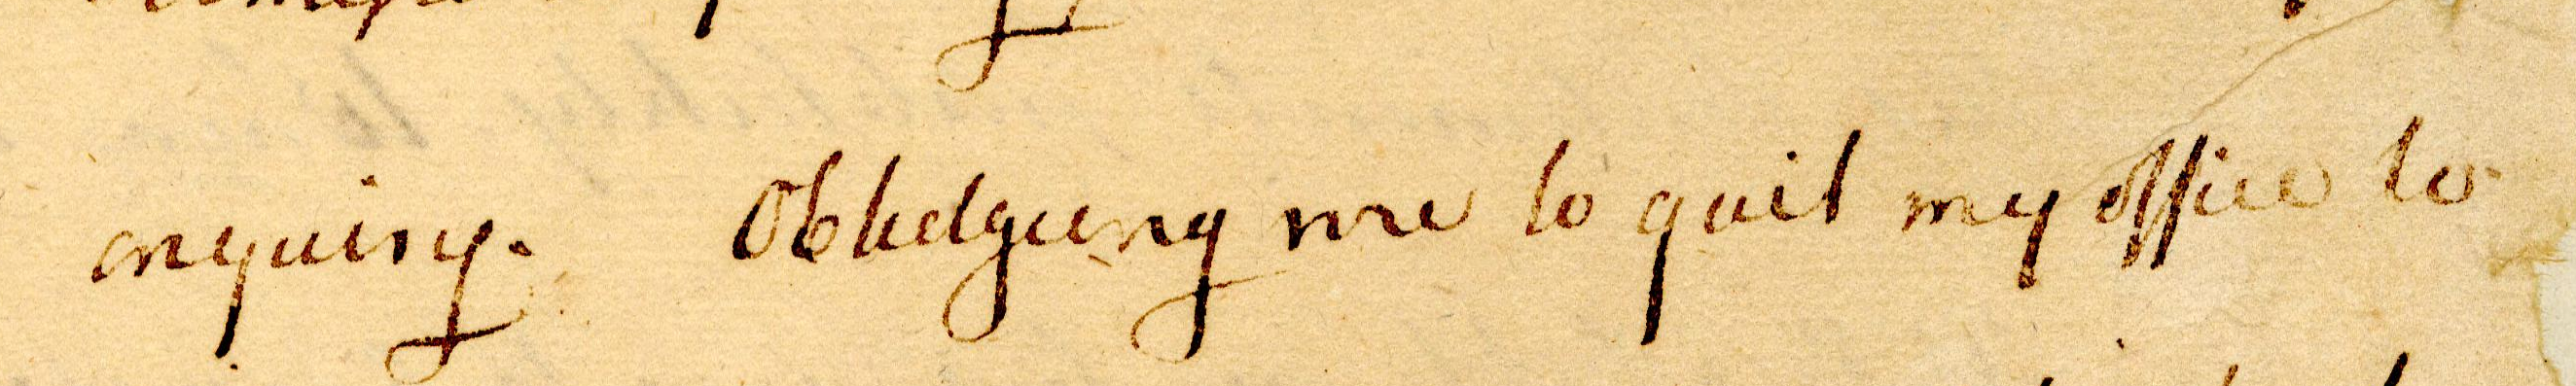enquiry. Oblidging me to quit my office to
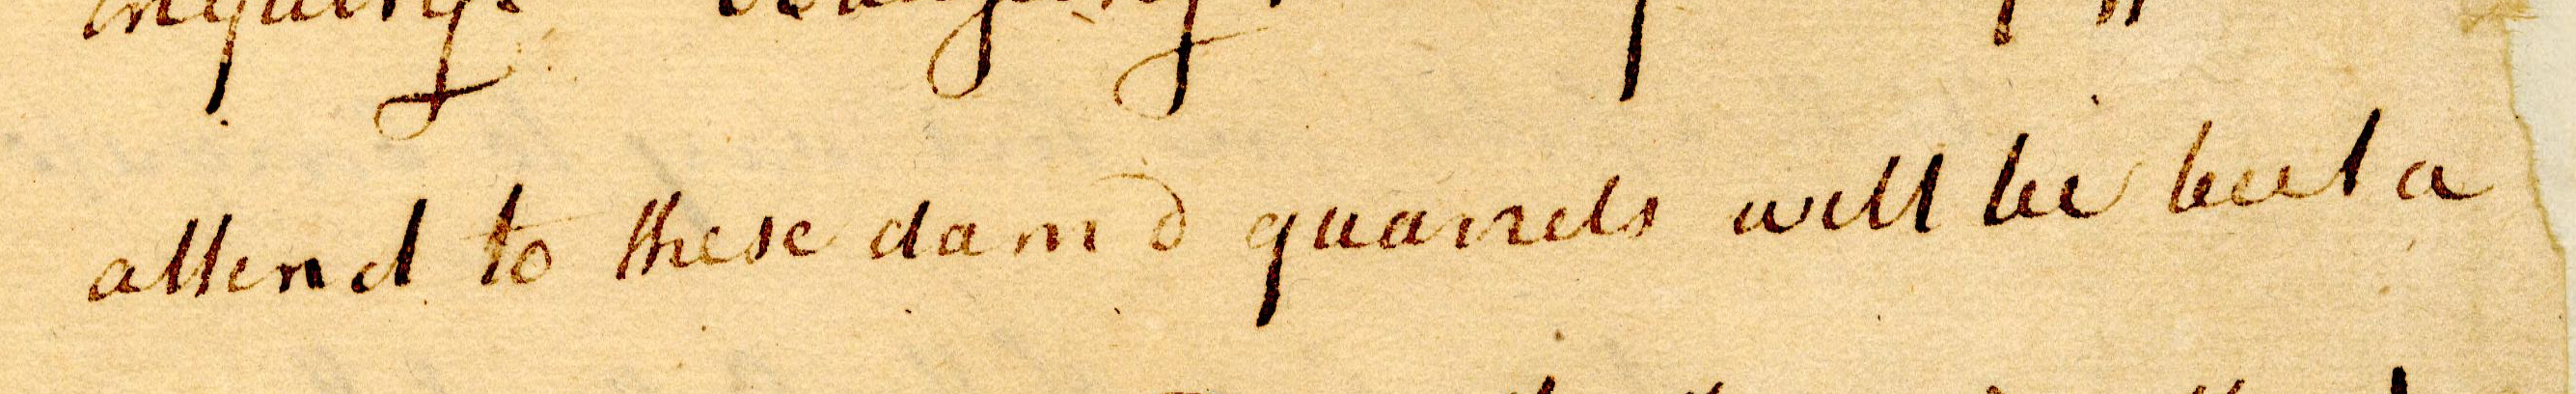attend to these damd quarrels will be but a
